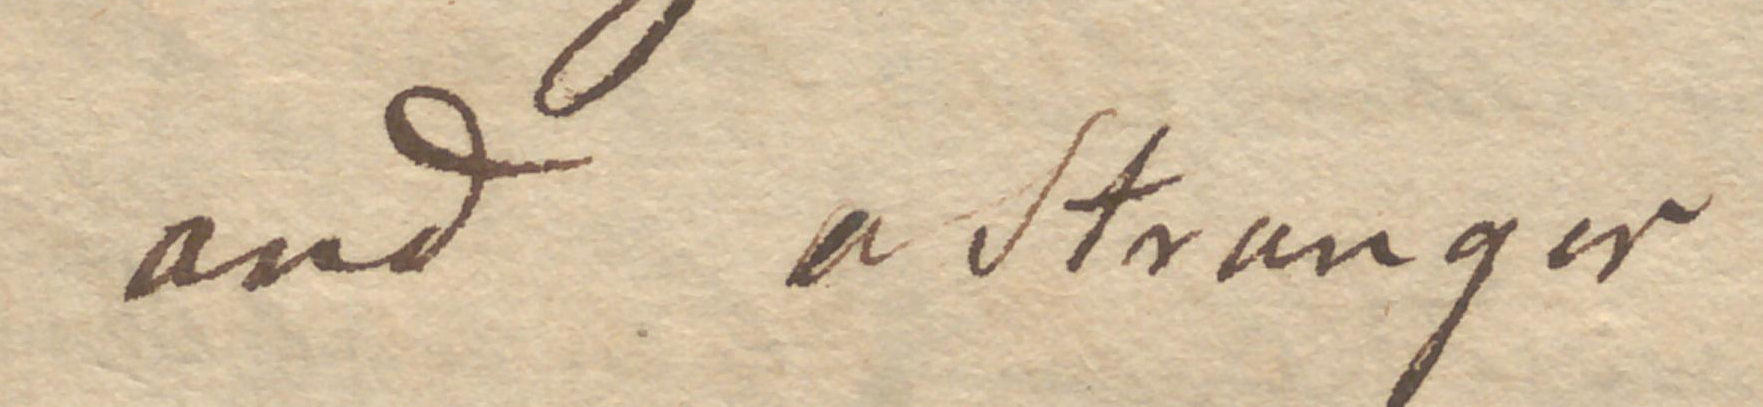and a Stranger
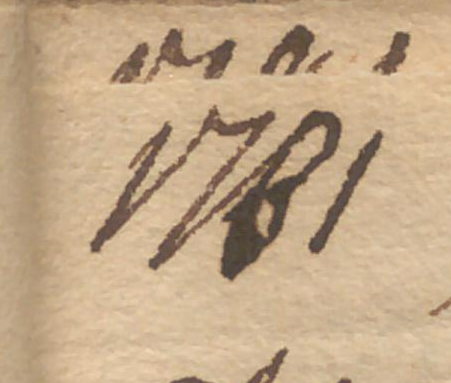1781
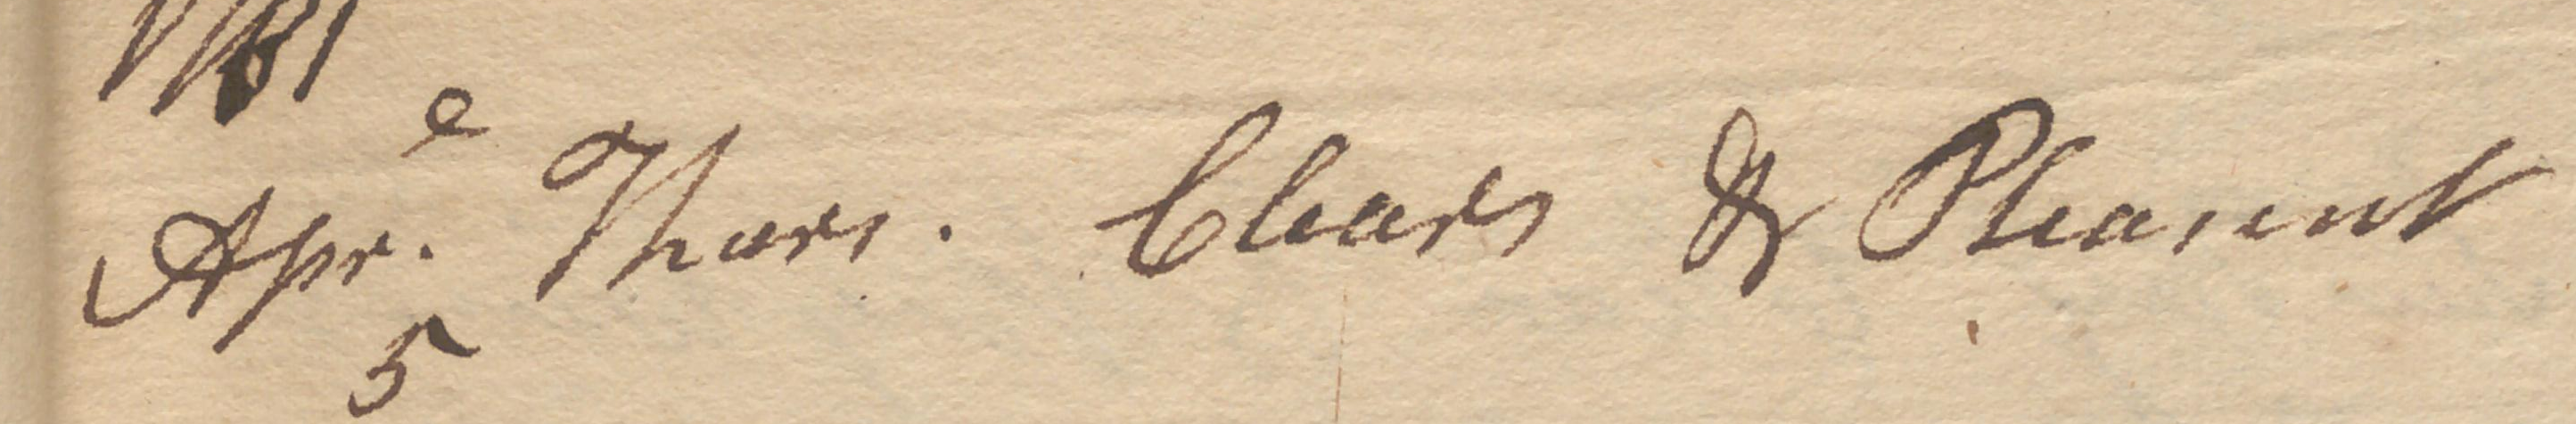Apr^l. Thurs. Clears & Pleasent
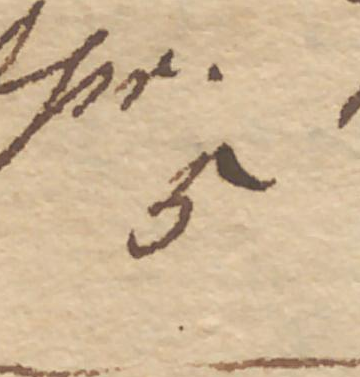5
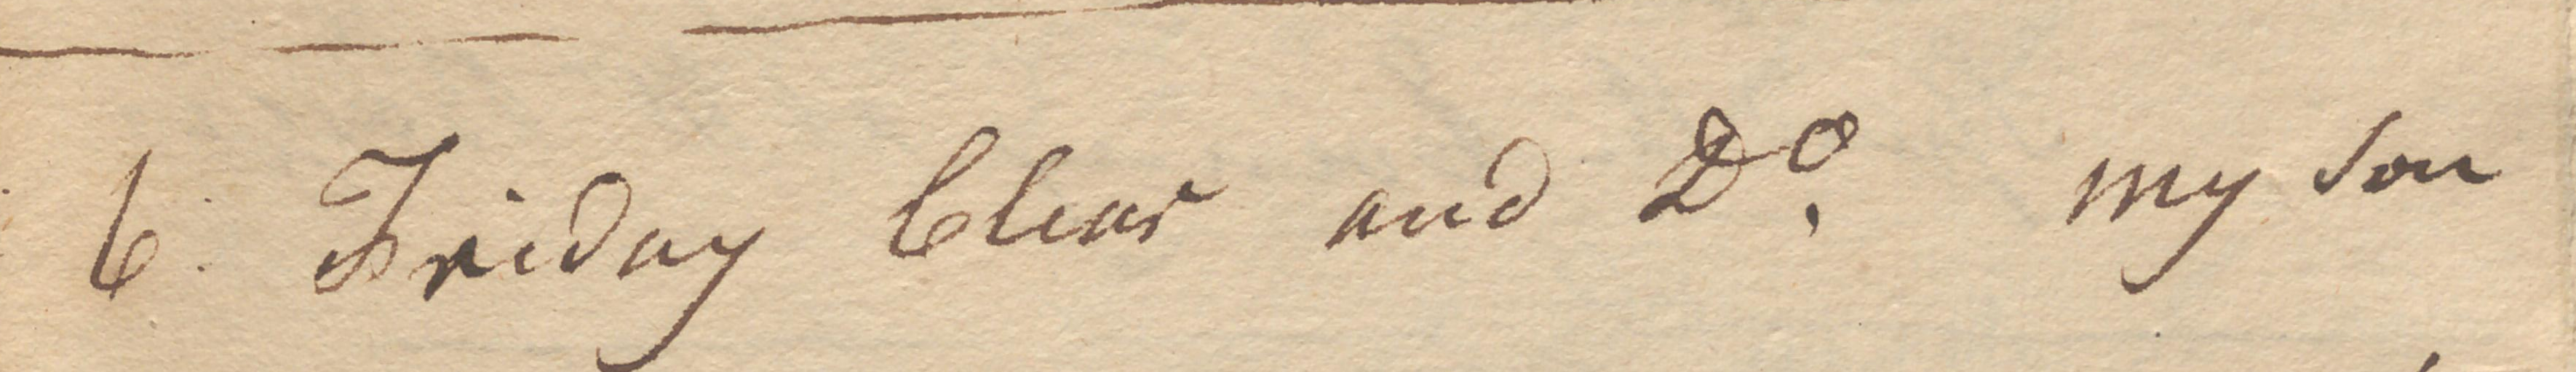6. Friday Clear and D^o. my son
